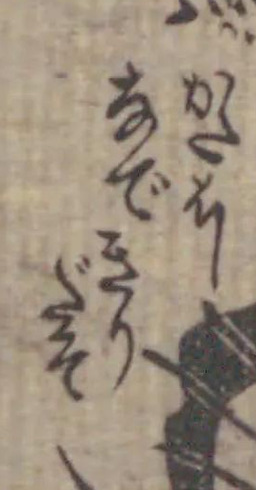なできり
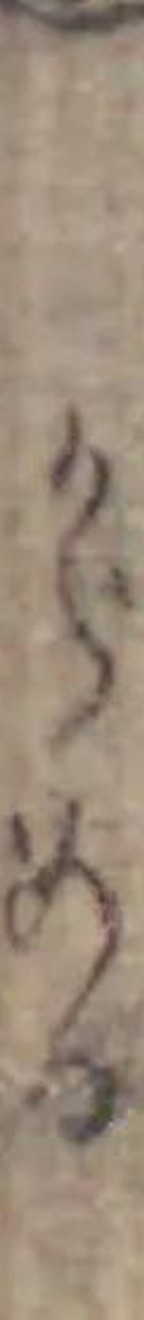からめる
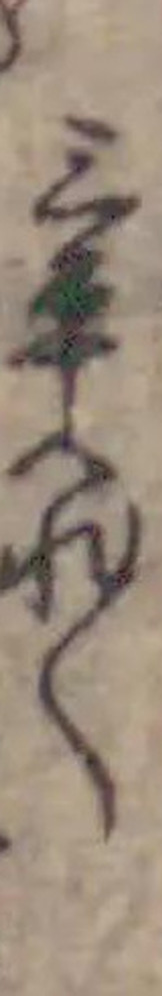三平へれ〳〵
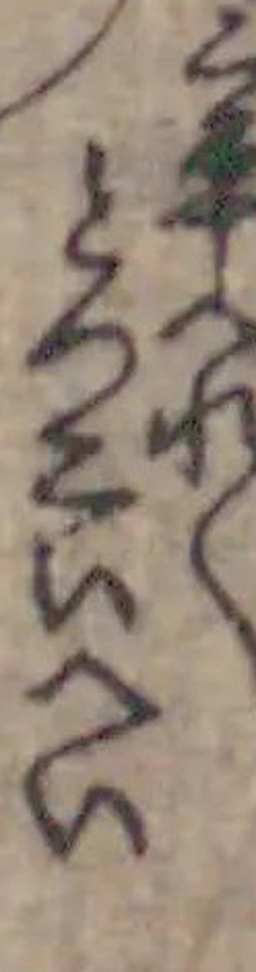とつこいへい

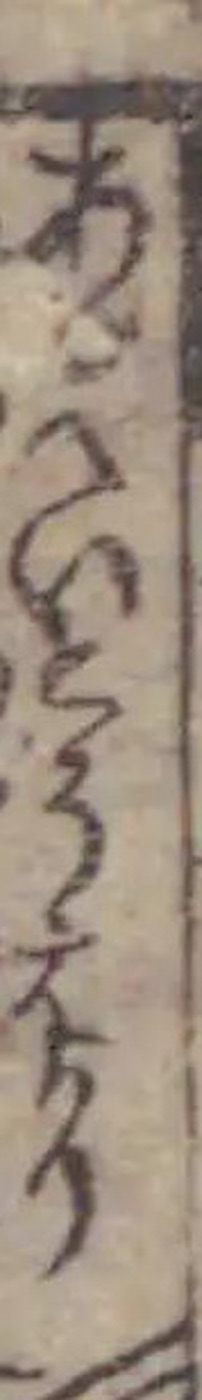あるへいとうはかり
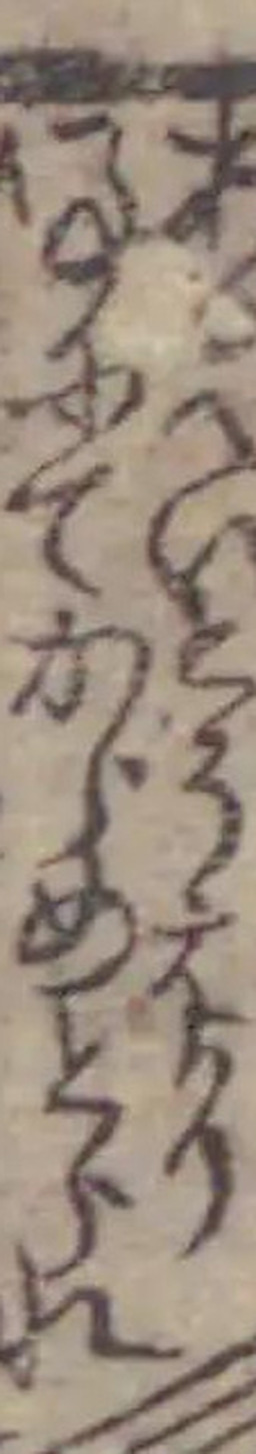事にてからめとられ
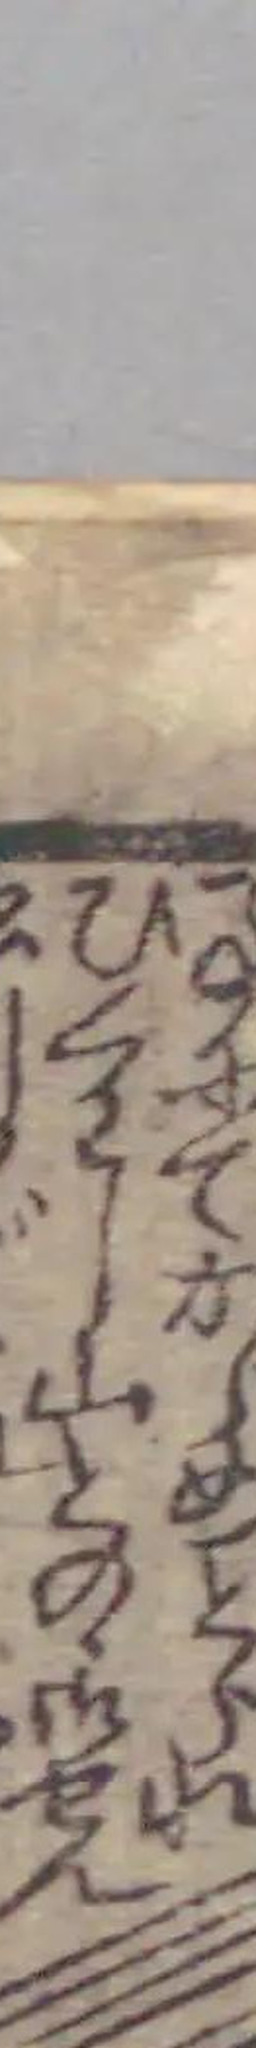ひくわし山とのゝ御せん
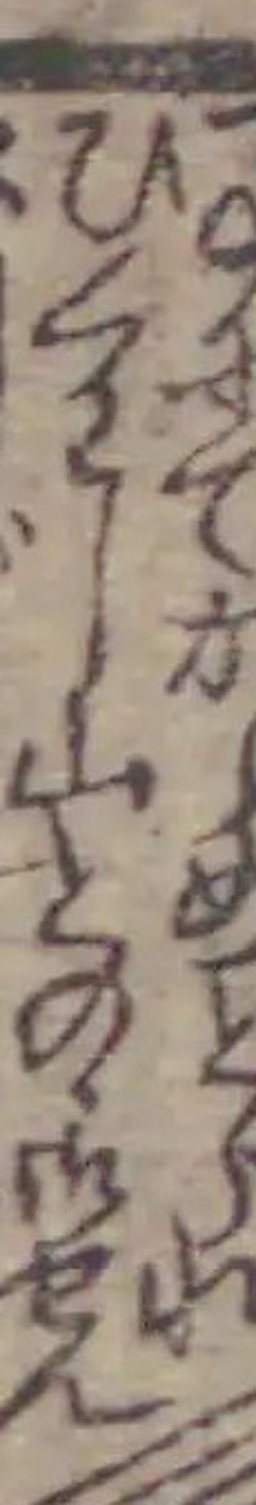ひくわし山とのゝ御せん
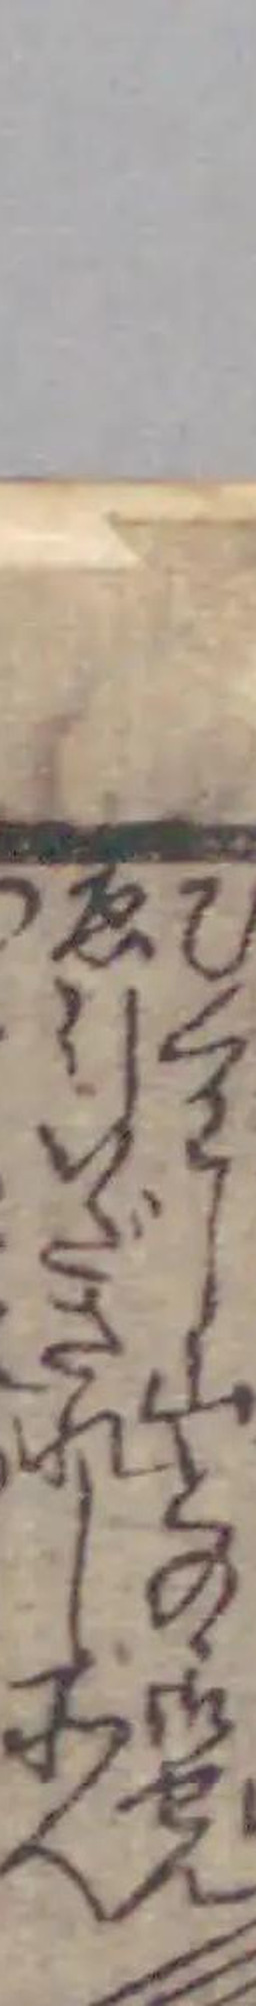ゑ引いだされし所へ
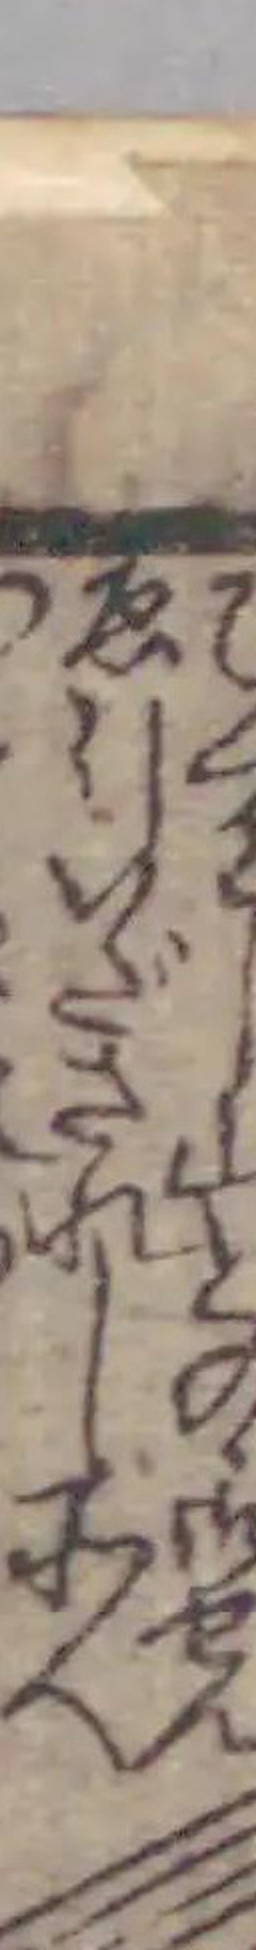ゑ引いだされし所へ
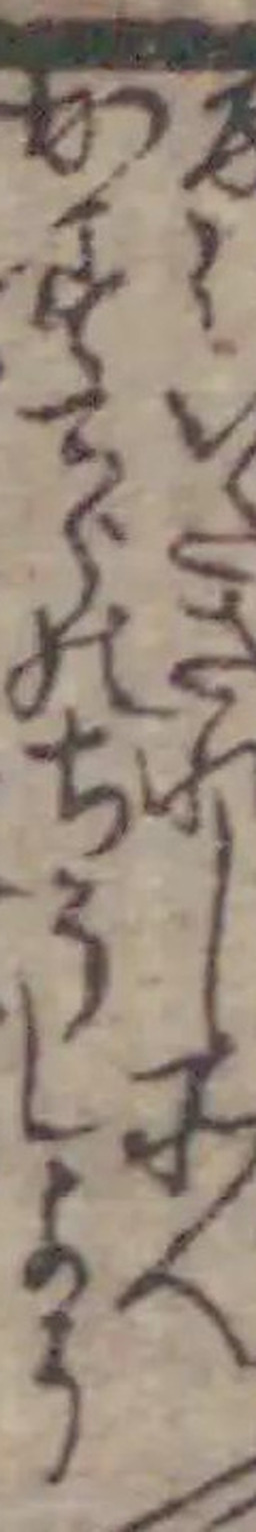かすてらのちうしよう
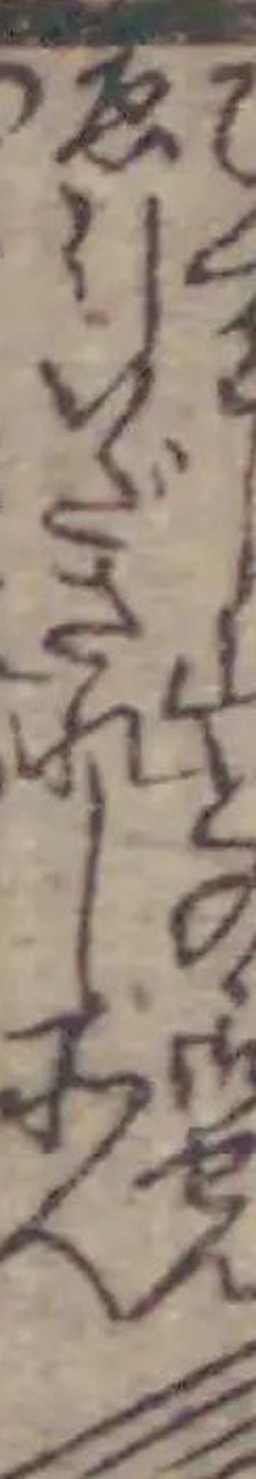ゑ引いだされし所へ
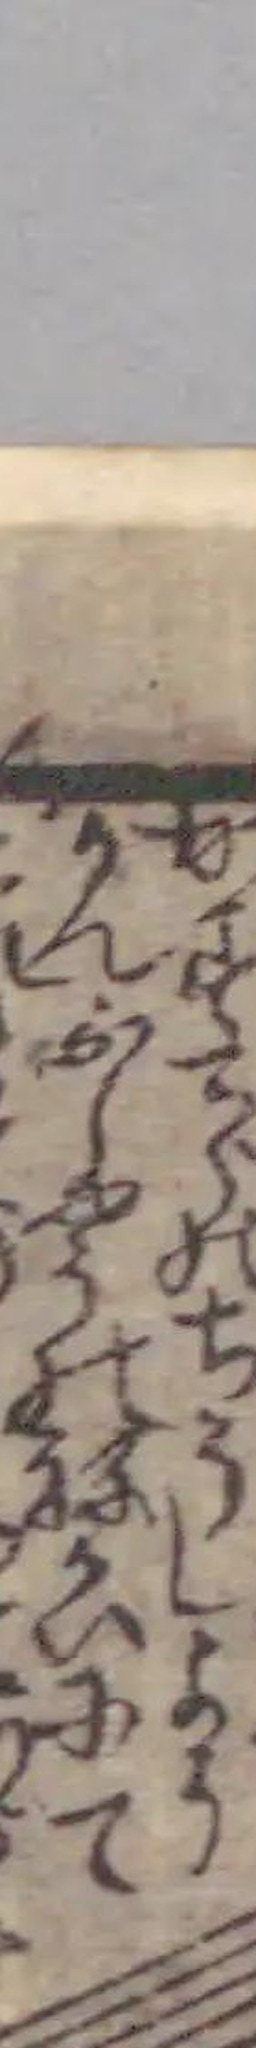かんおしやうのねかいにて
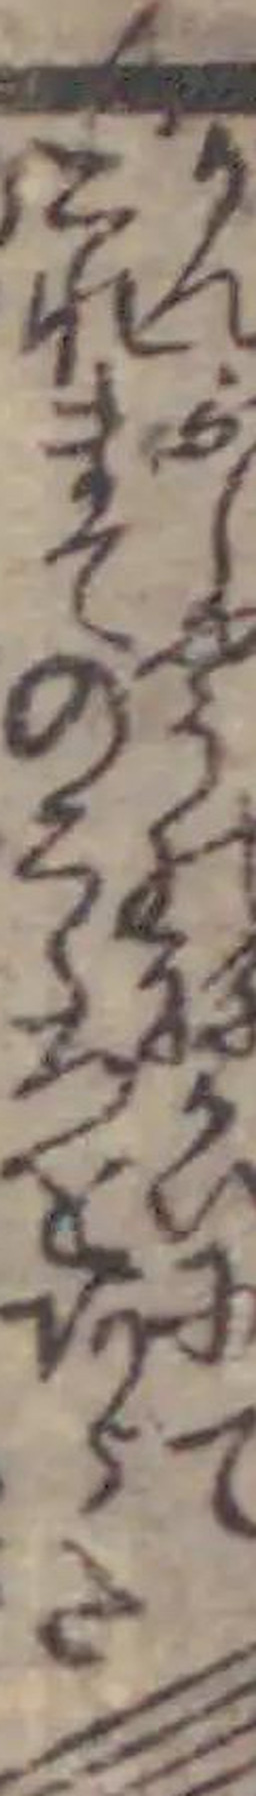これまてのこゝろをあらた
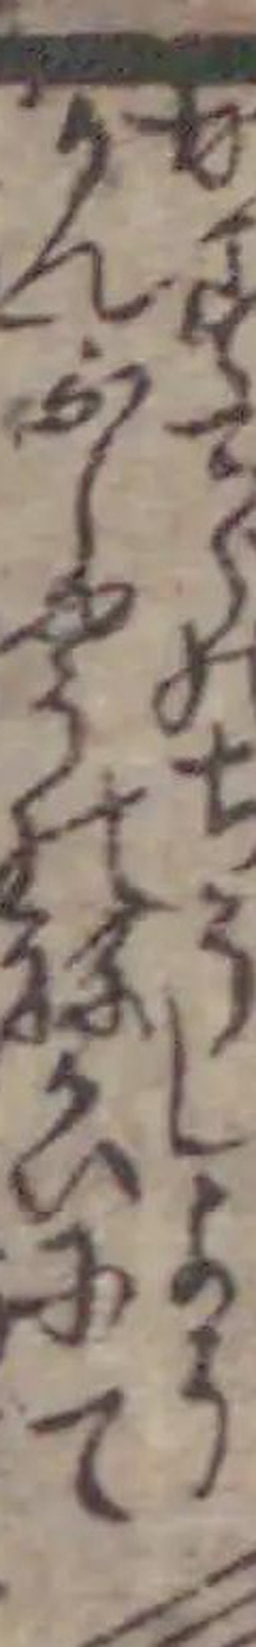かんおしやうのねかいにて
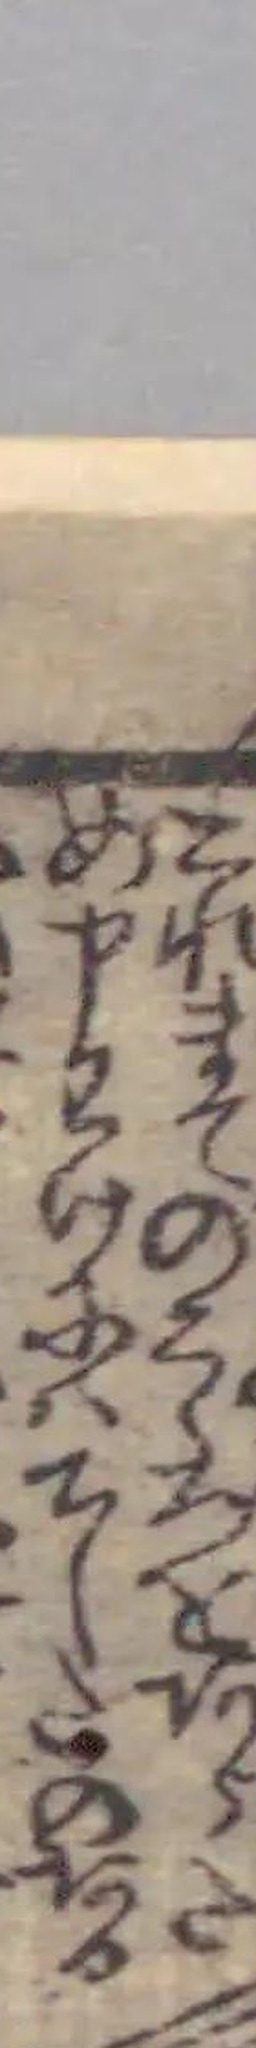め申わけにはてしたのある
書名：名代干菓子山殿 3巻
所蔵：国立国会図書館 National Diet Library, JAPAN
